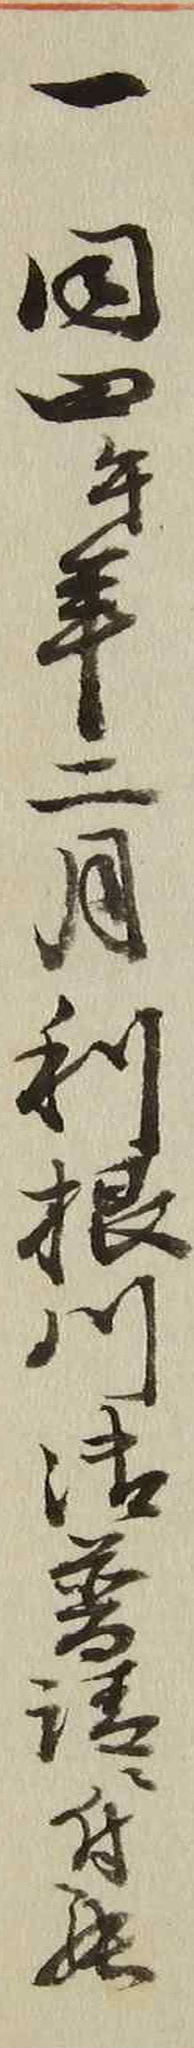一同四午年二月利根川御普請ニ付罷
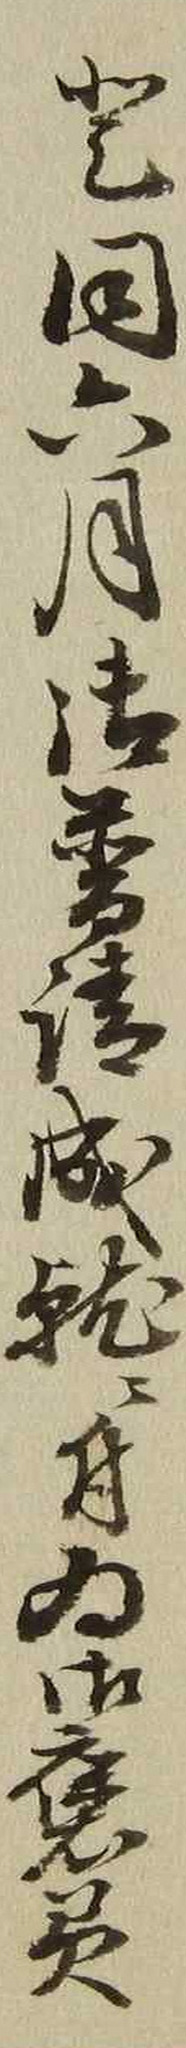登同六月御普請成就ニ付為御褒美
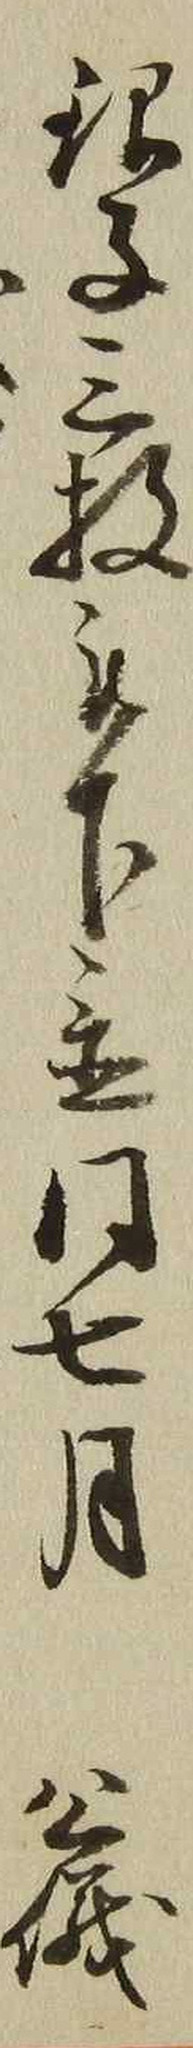銀子三枚被下置同七月公儀
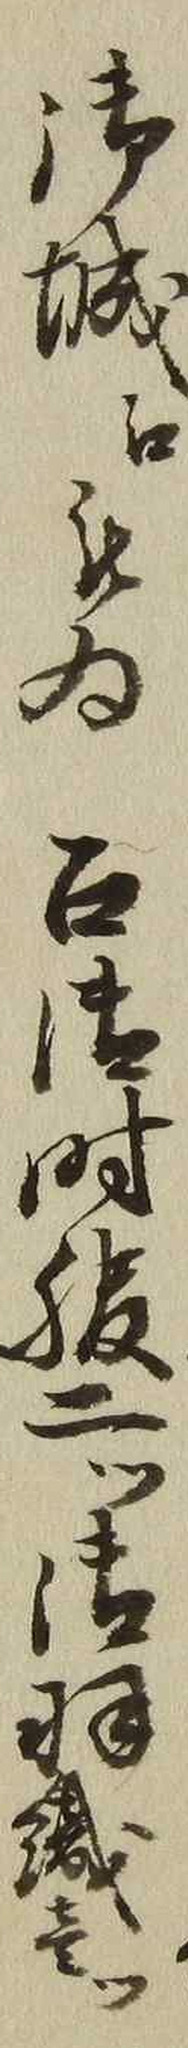御城江被為召御時服二ッ御羽織壱ッ
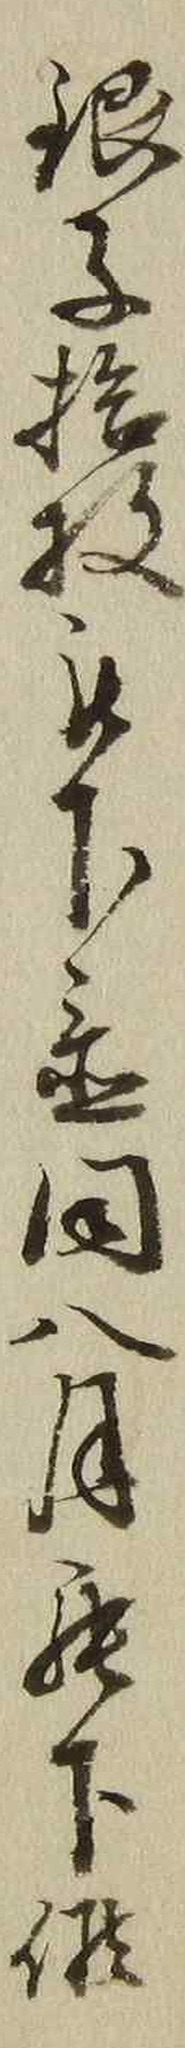銀子拾枚被下置同八月罷下候
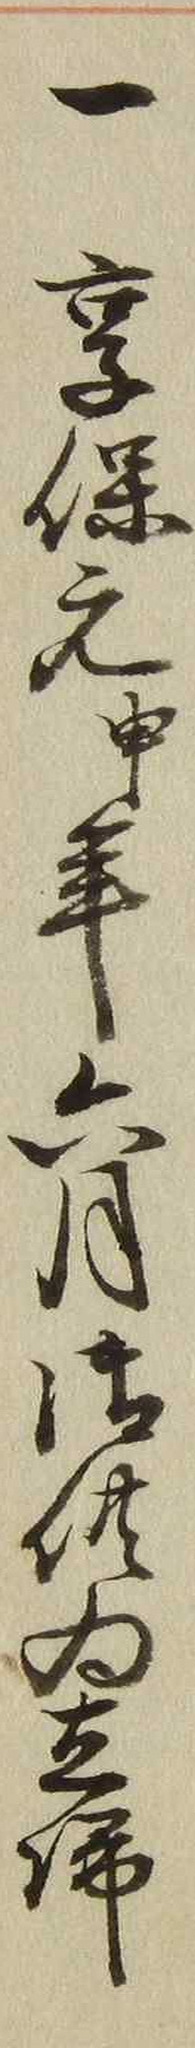一享保元申年六月御供為立帰
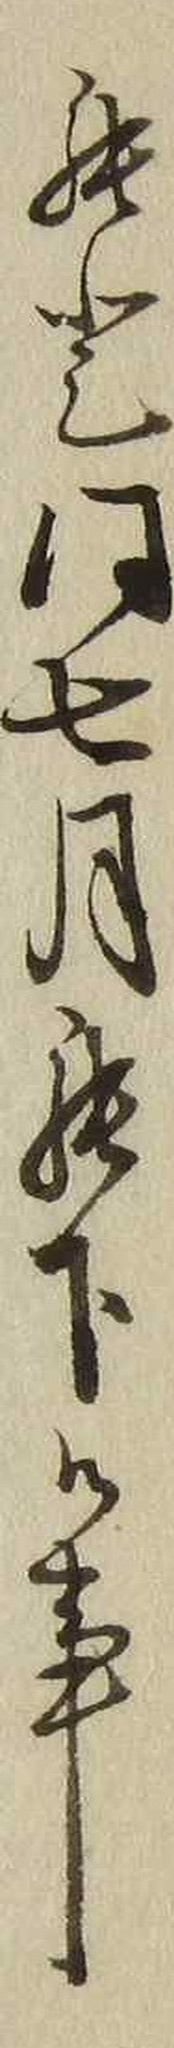罷登同七月罷下候事
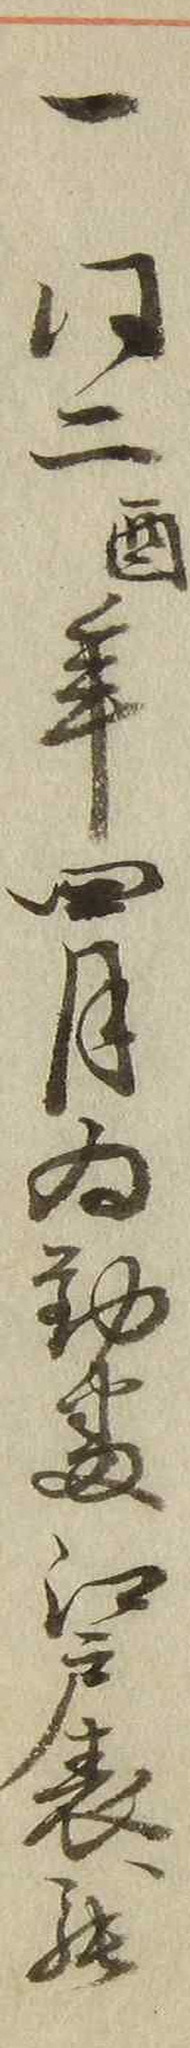一同二酉年四月為勤番江戸表へ罷
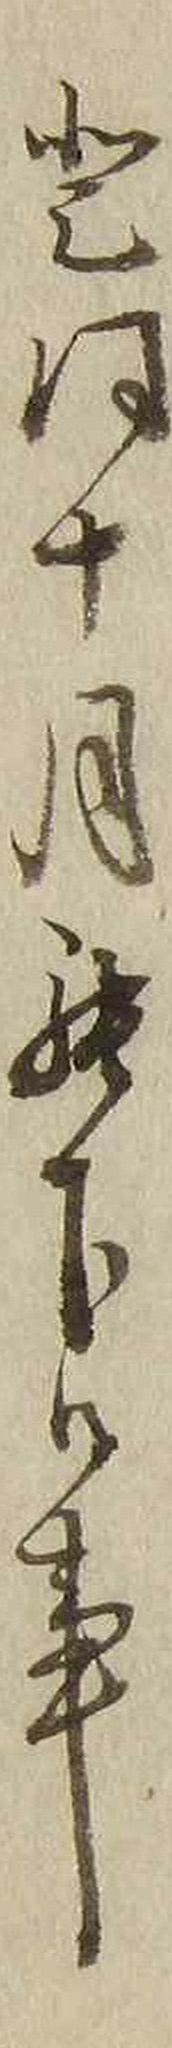登同十月罷下候事
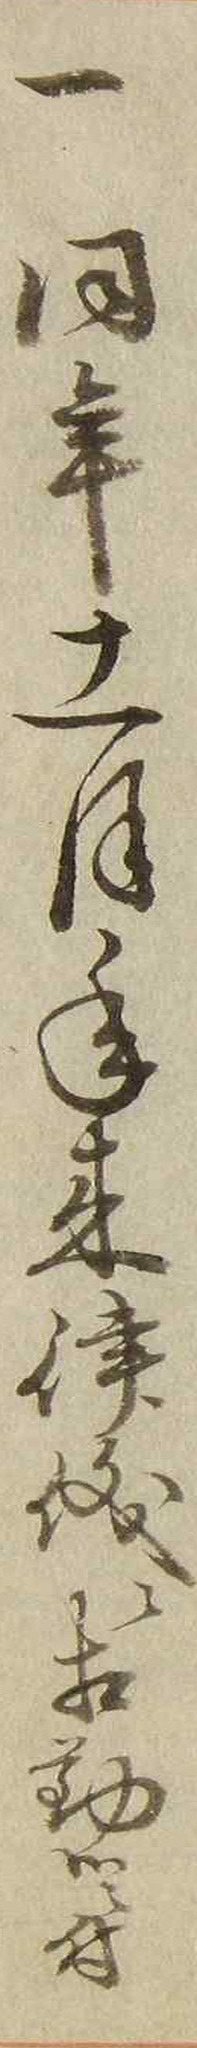一同年十一月年来律儀ニ相勤候ニ付

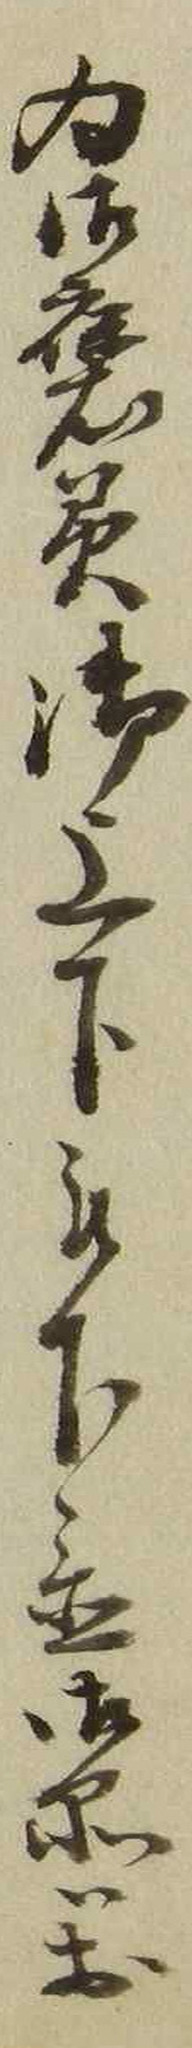為御褒美御上下被下置御品ハ於
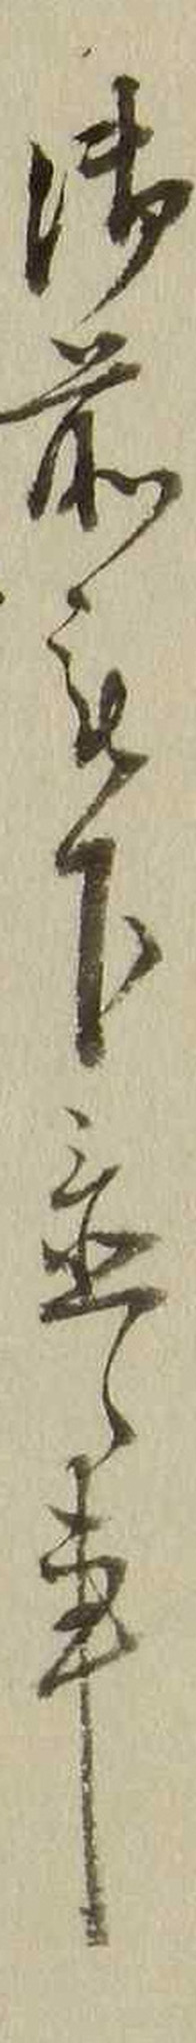御前被下置候事
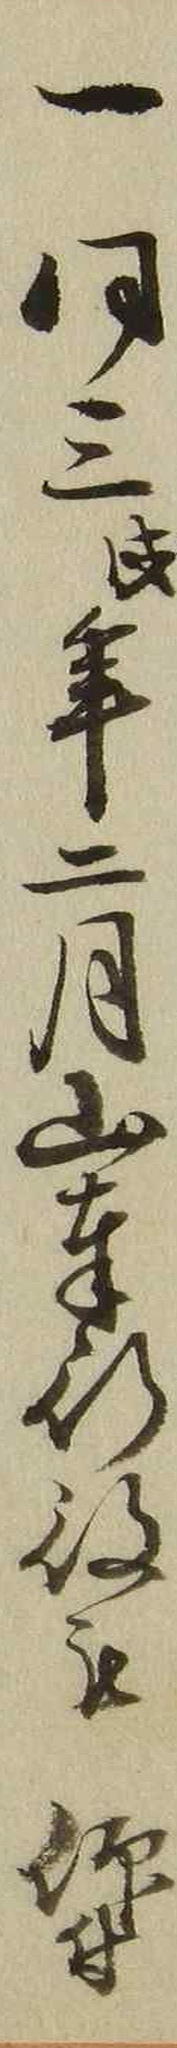一同三戌年二月山奉行役被仰付
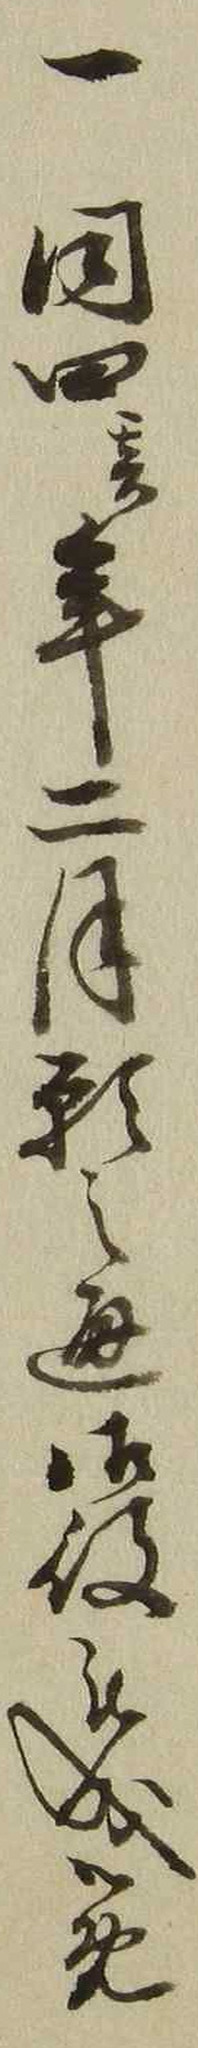一同四亥年二月願之通御役被成御免
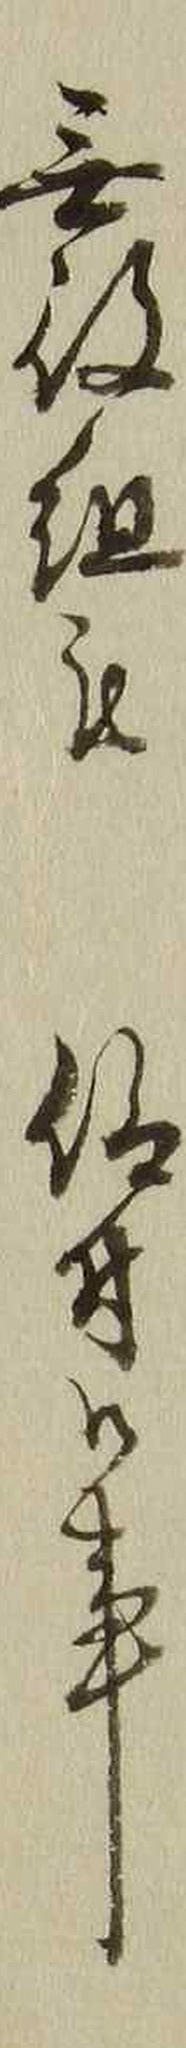無役組被仰付候事
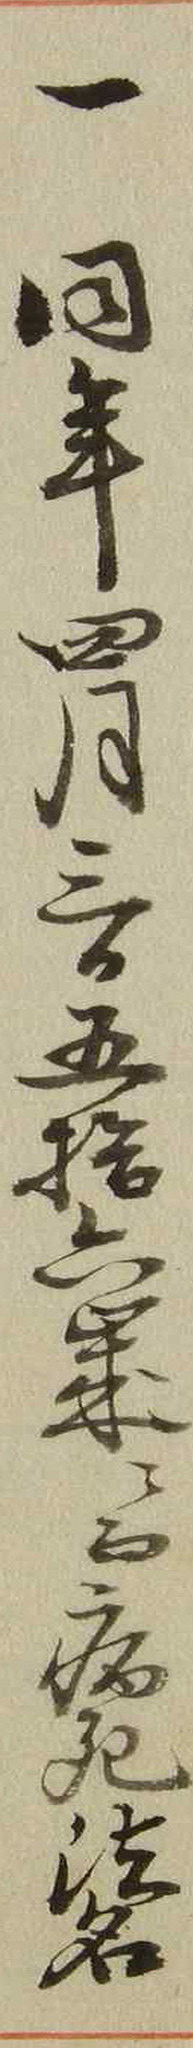一同年四月三日五拾六歳ニ而病死法名
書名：諸士系譜　巻之31　い之部31
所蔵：会津若松市立会津図書館
